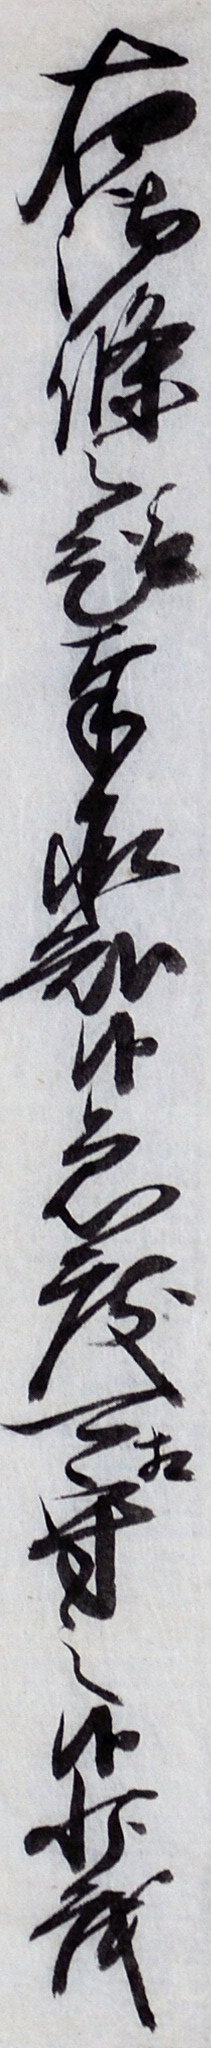右御条之趣奉承知候急度可相守之候少も
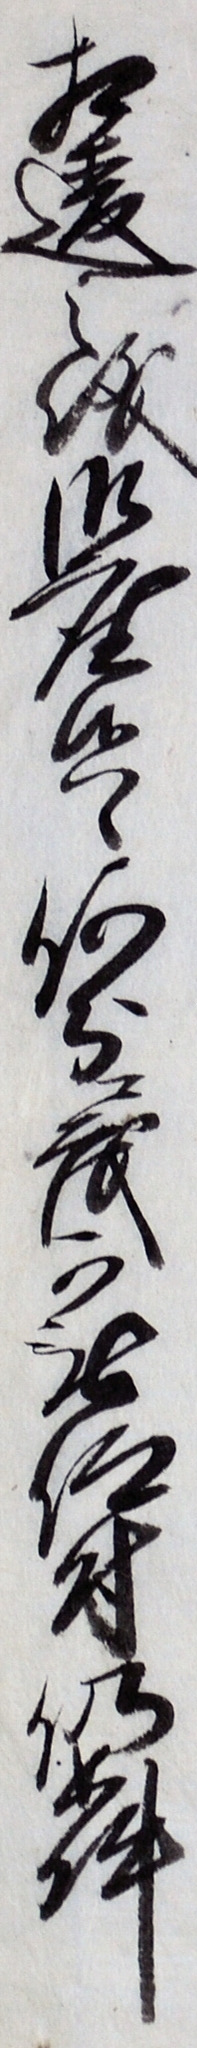相違之儀御座候ハヽ何分ニも可被仰付仍如件
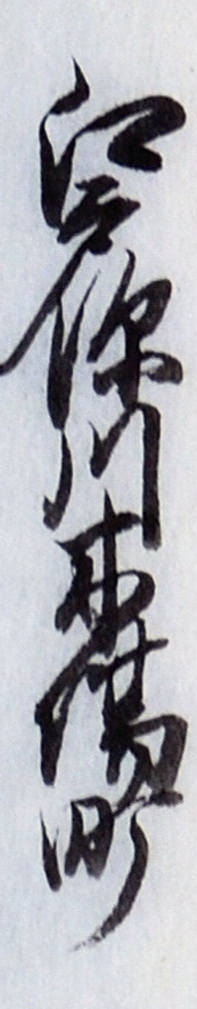江戸深川木場町
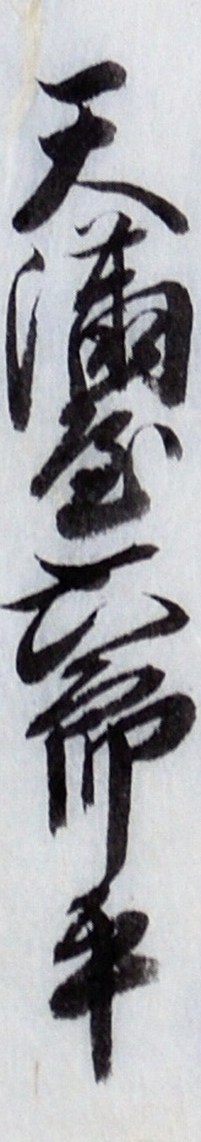天満屋六郎平
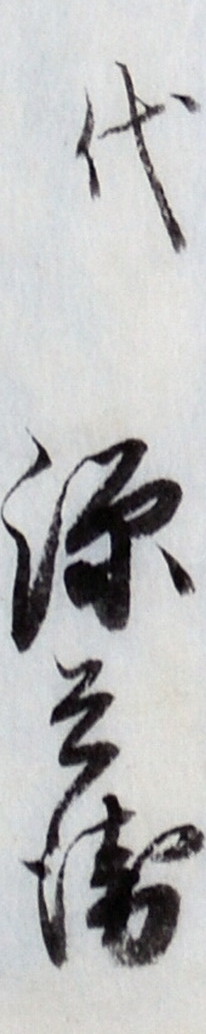代源兵衛
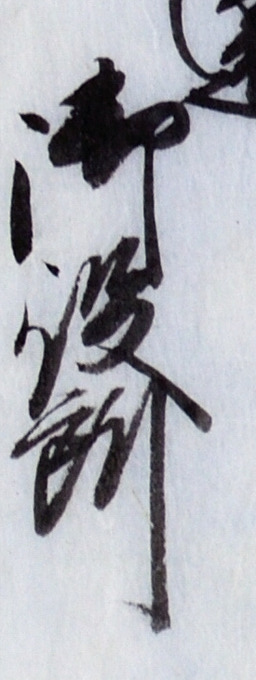御役所

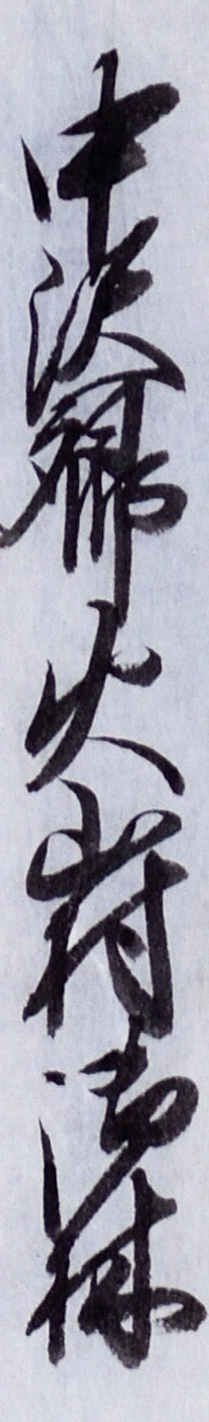中沢郷火山村御林
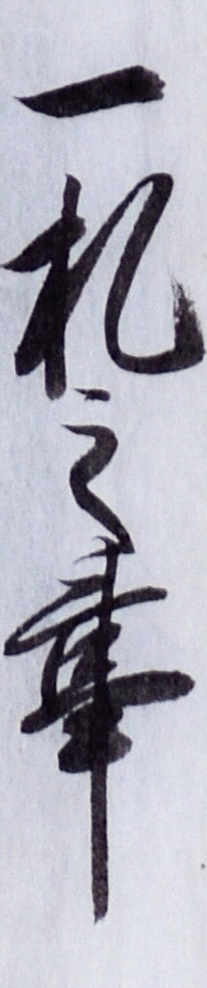一札之事
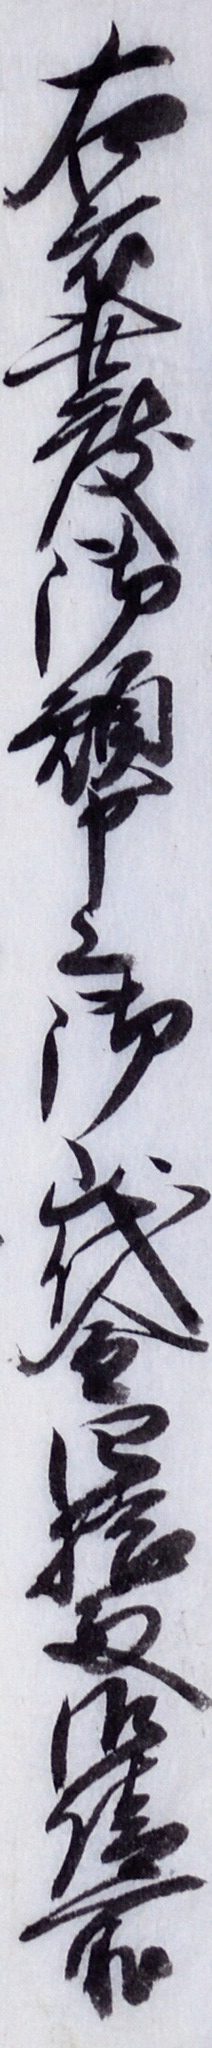右者此度御願申上御山代金四拾両御請所
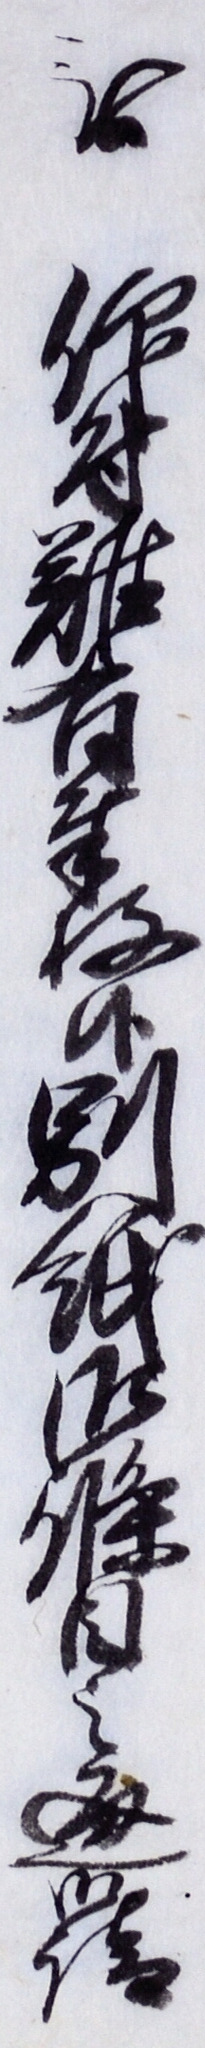被仰付難有奉存候別紙御条目之通御請
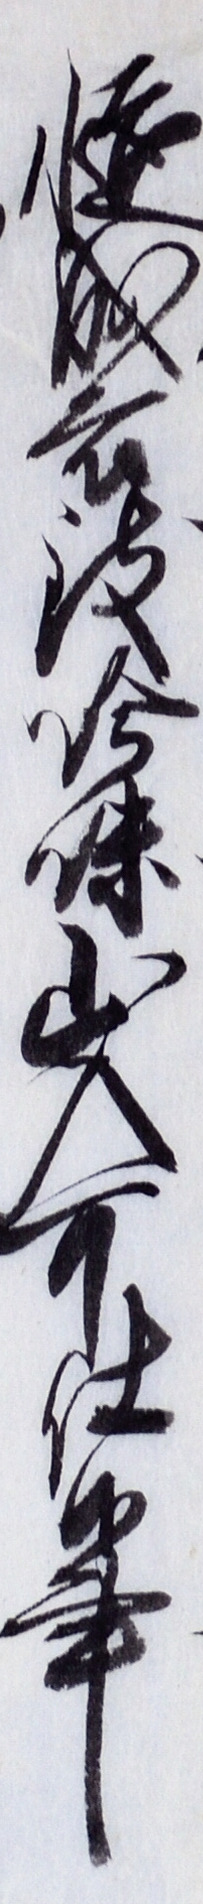慥成者致吟味山入可仕候事
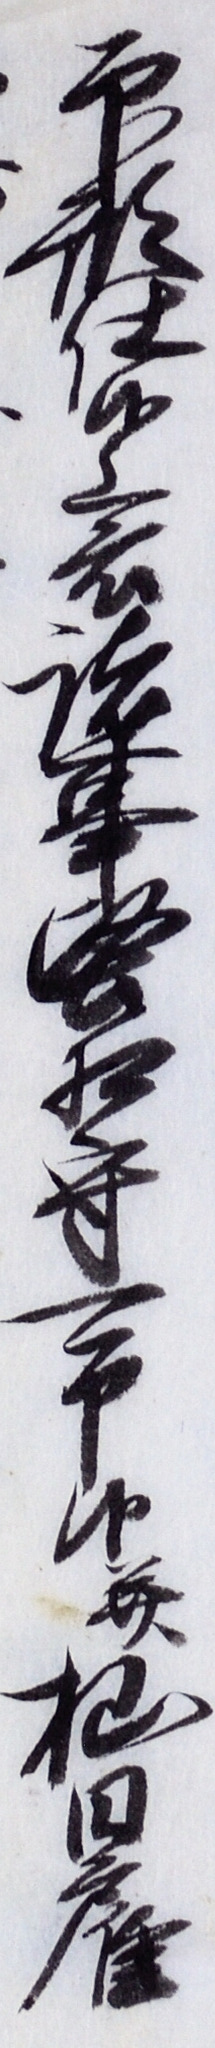印形仕候上者諸事堅相守可申候幷杣日雇
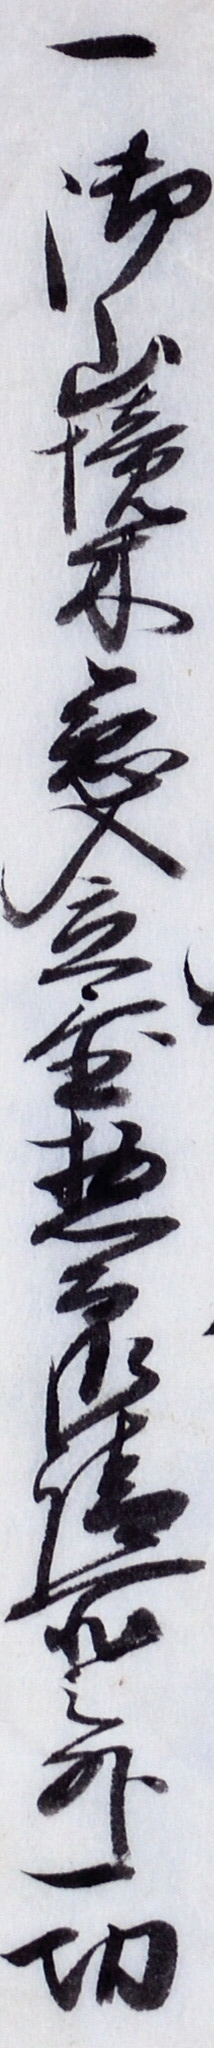一御山境木念入立置惣而御請所之外一切
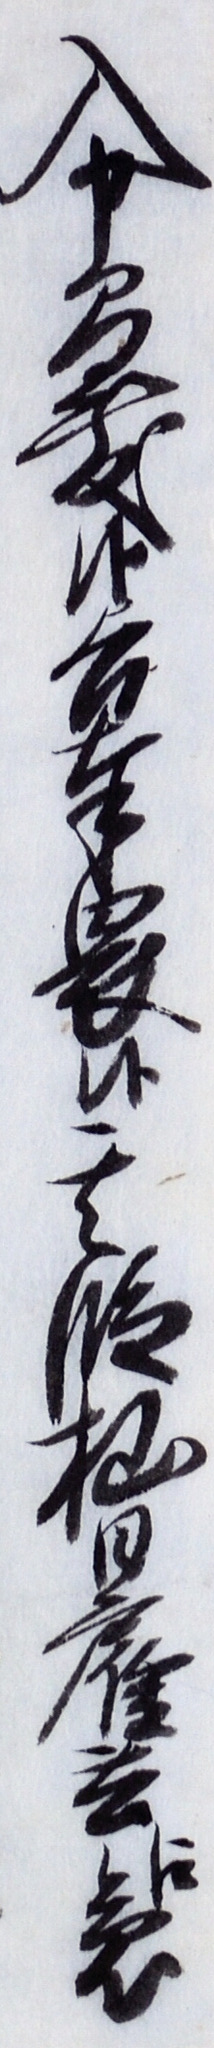入申間敷候旨奉畏候其段杣日雇共江急
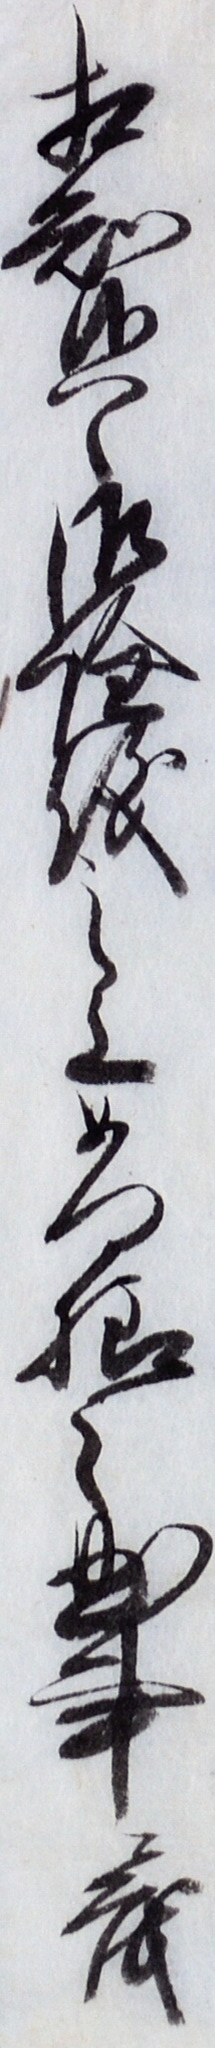相知候ハヽ御詮儀之上如何様之曲事ニも
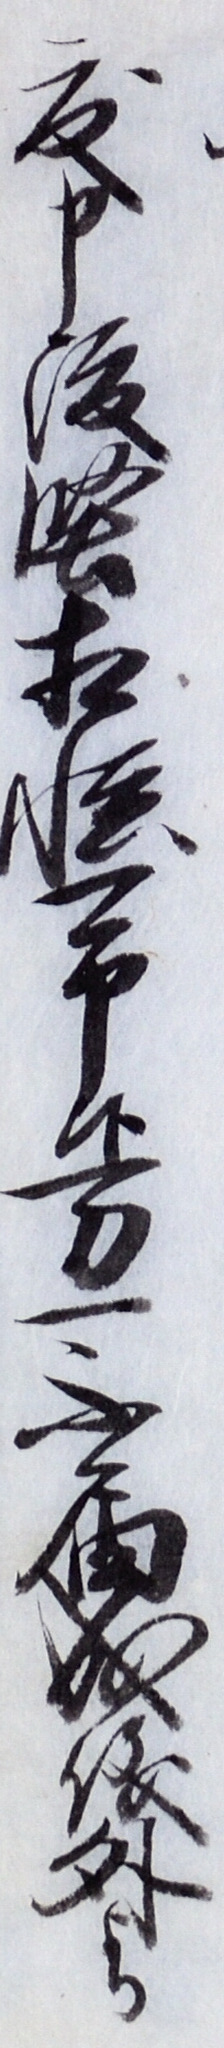度申渡堅相慎可申候万一不届成儀外より
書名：御持山御払掟書願書控
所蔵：伊那市立高遠町図書館・合同会社AMANE
